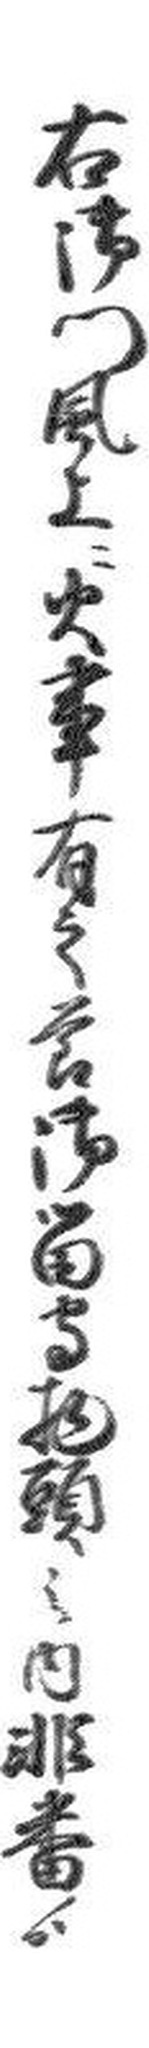右御門風上ニ火事有之節御留守物頭之内非番ゟ
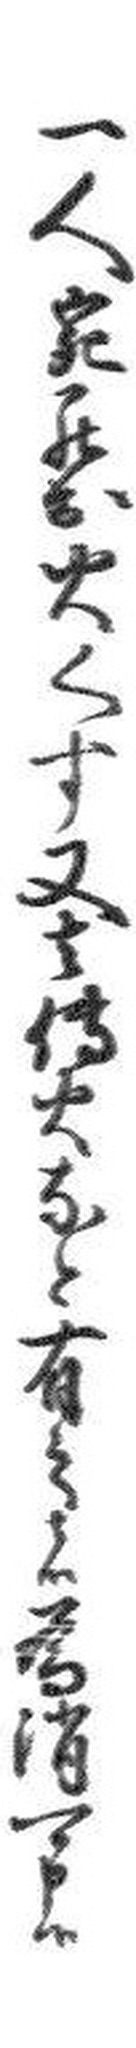一人宛罷出火くす又者伝火なと有之者為消可申候
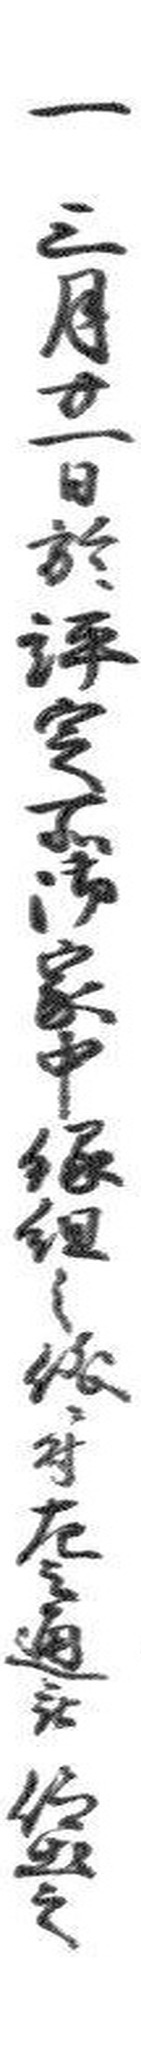一三月廿一日於評定所御家中縁組之儀ニ付左之通被仰出之
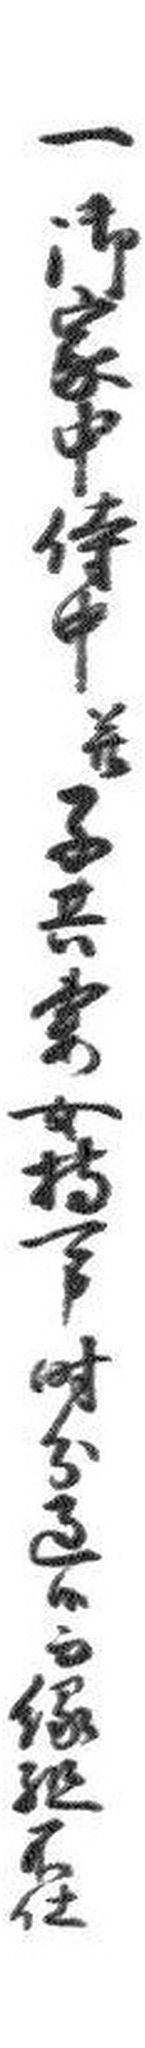一御家中侍中并子共妻女持可申時分過候而縁組不仕

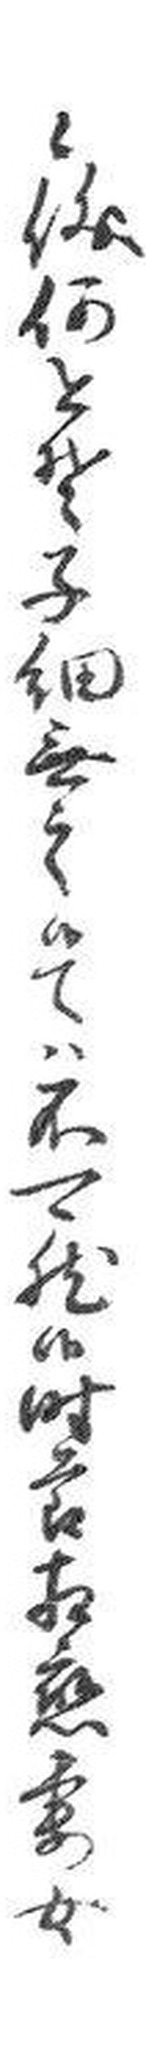候儀何とそ子細無之候ては不可然候時節相応妻女
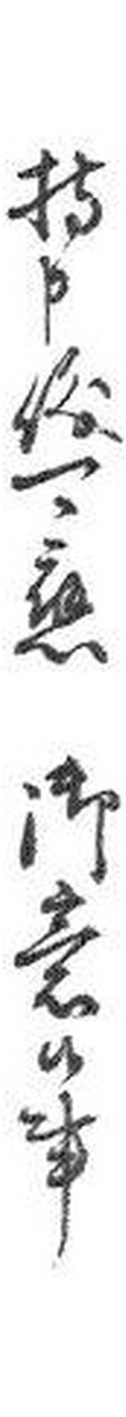持申儀可応御意候事
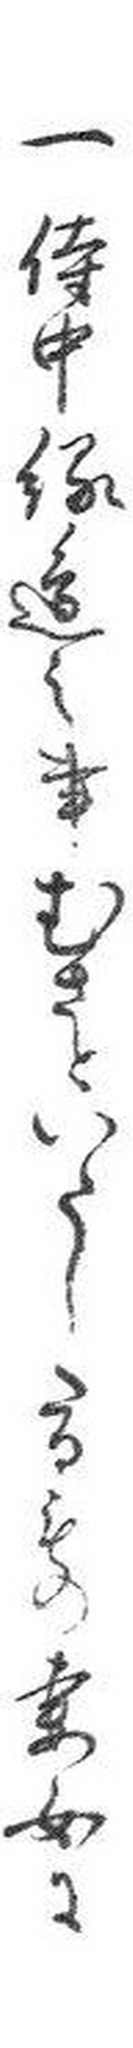一侍中縁辺之事むさといたしたるもの妻女に
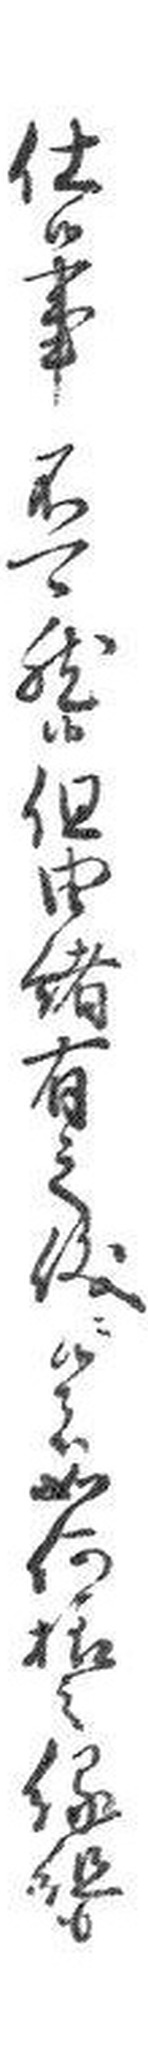仕候事不可然候但由緒有之儀ニ候者如何様之縁組も
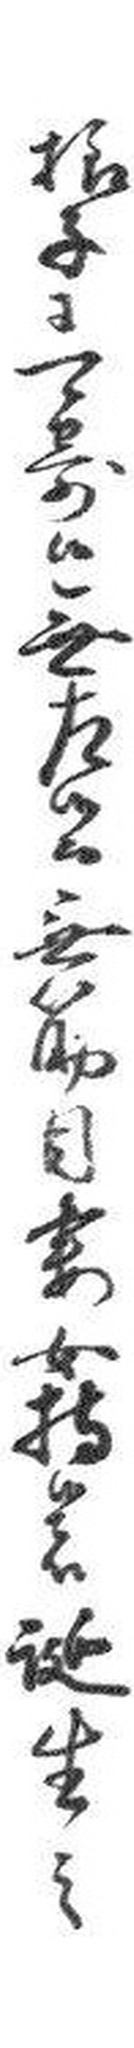様子に可寄候無左候而無筋目妻女持候者誕生之
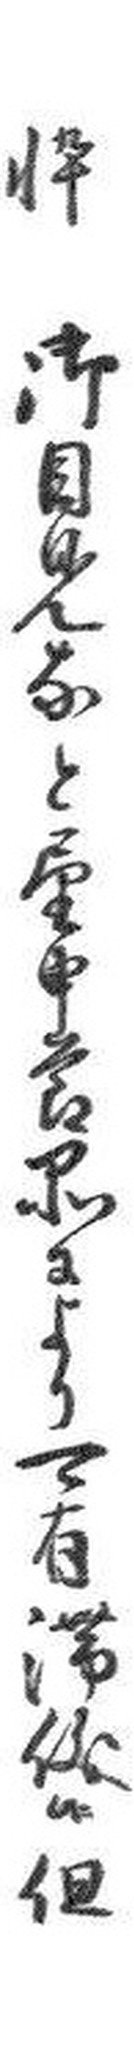忰御目見なと望申節品により可有滞儀候但
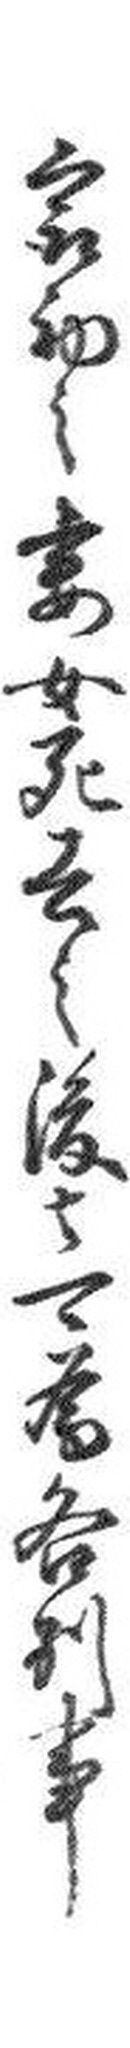最初之妻女死去之後者可為各別事
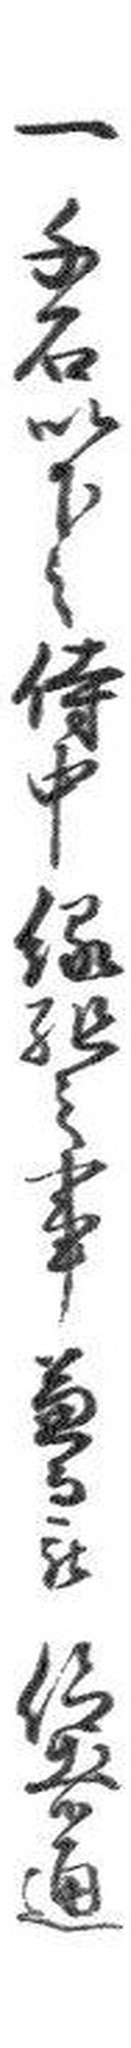一千石以下之侍中縁組之事兼而被仰出候通
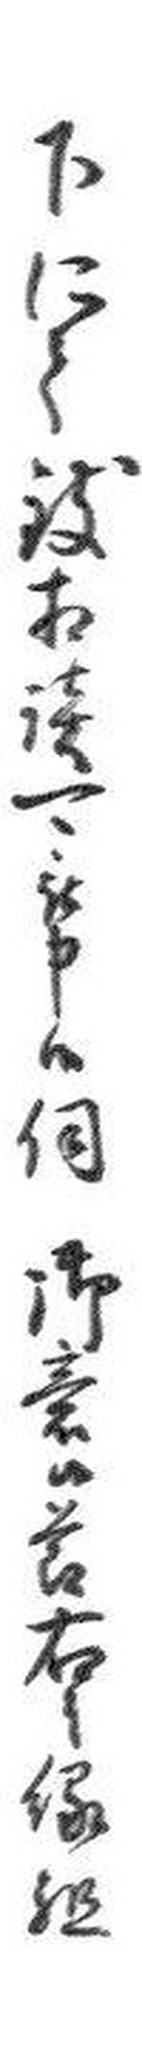下にて致相談可被申候伺御意候節右之縁組
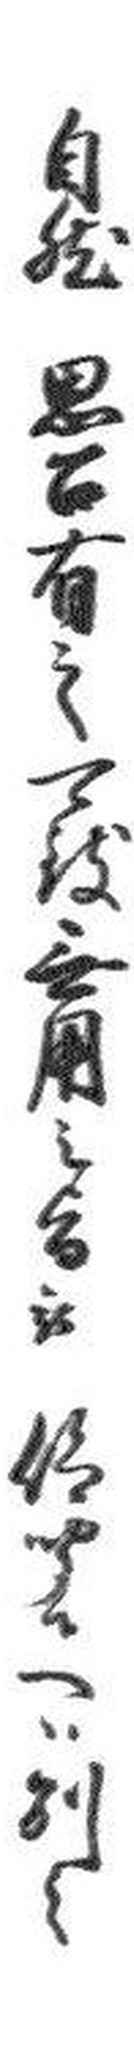自然思召有之可致無用之旨被仰聞候へは別之
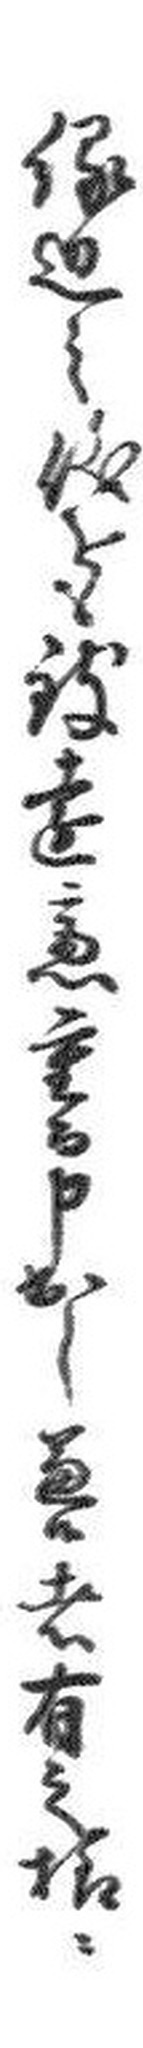縁辺之儀をも致遠慮重而申出し兼候者有之様ニ
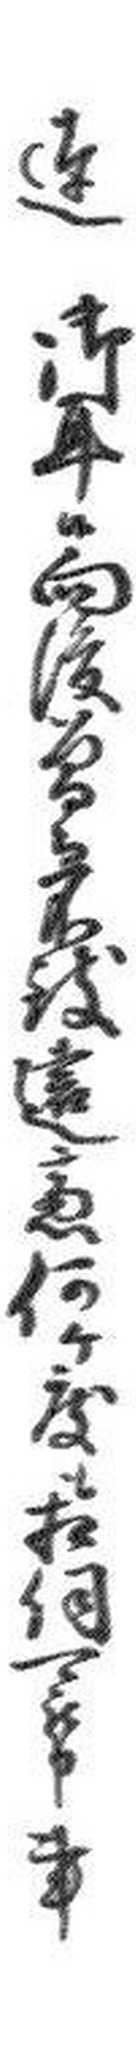達御耳候向後曽而不致遠慮何ケ度も相伺可被申事
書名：家譜 八 光通公 従寛文十年到同十二年
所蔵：福井県文書館 Fukui Prefectural Archives
